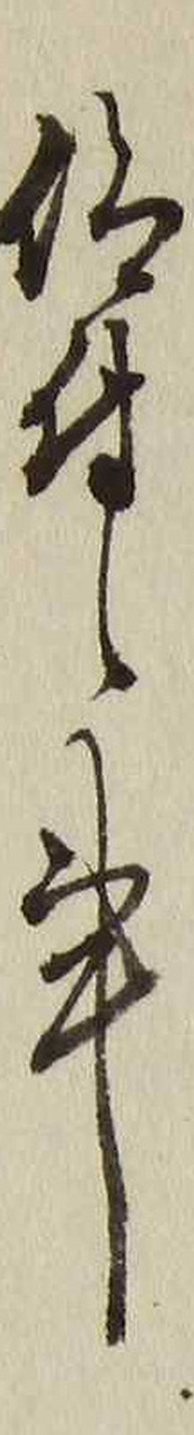仰付候事
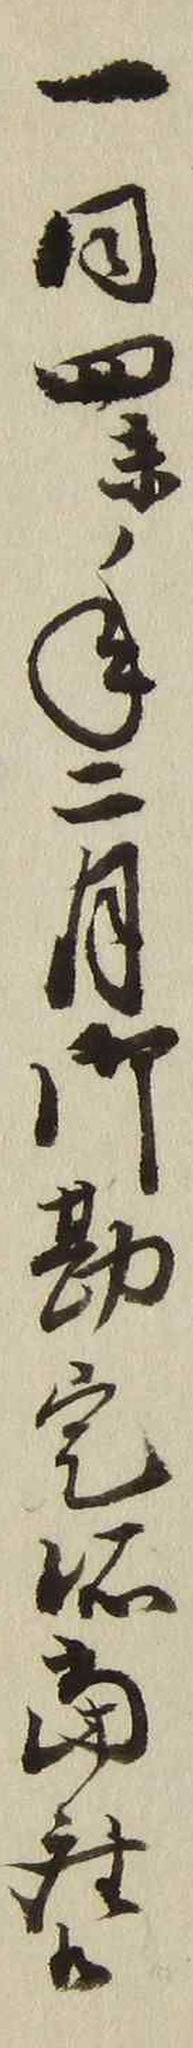一同四未年二月御勘定所当座御
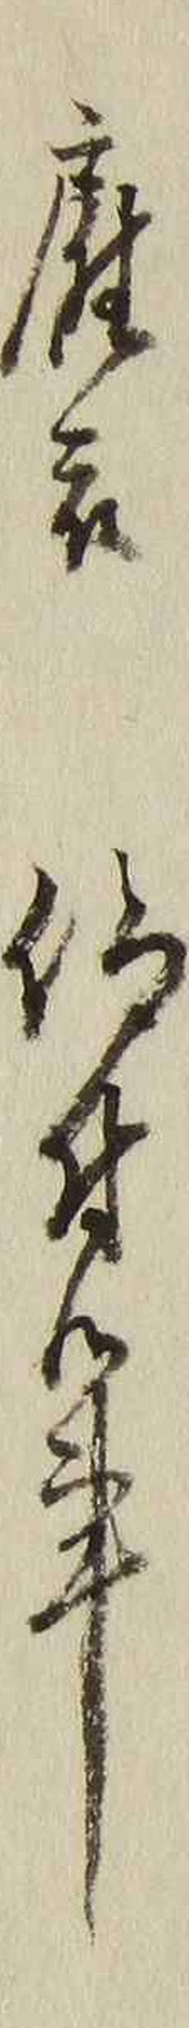雇被仰付候事
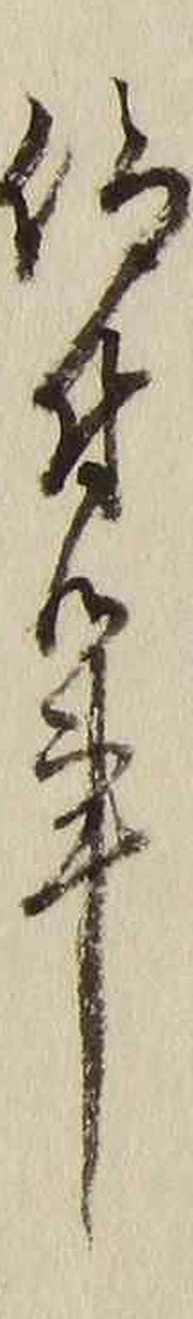仰付候事
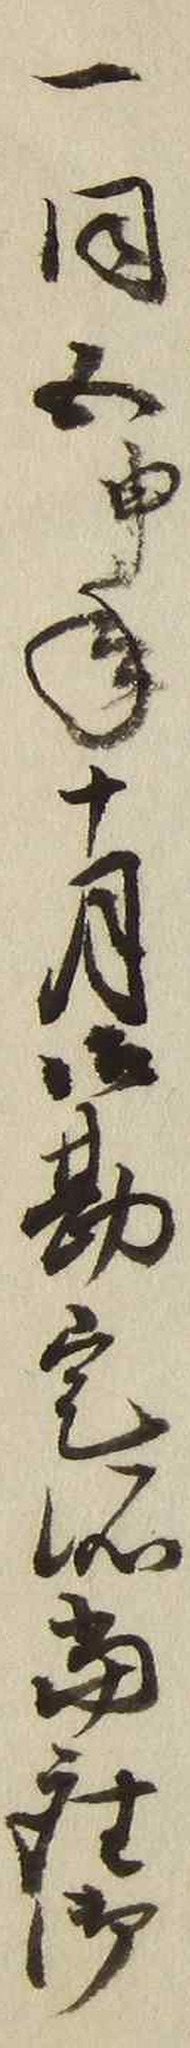一同五申年十月御勘定所当座御

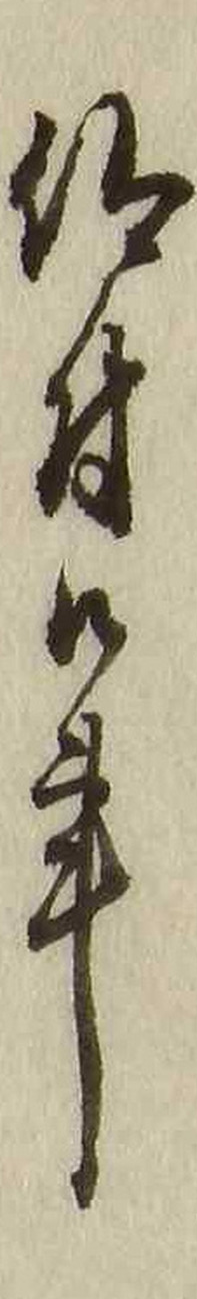仰付候事
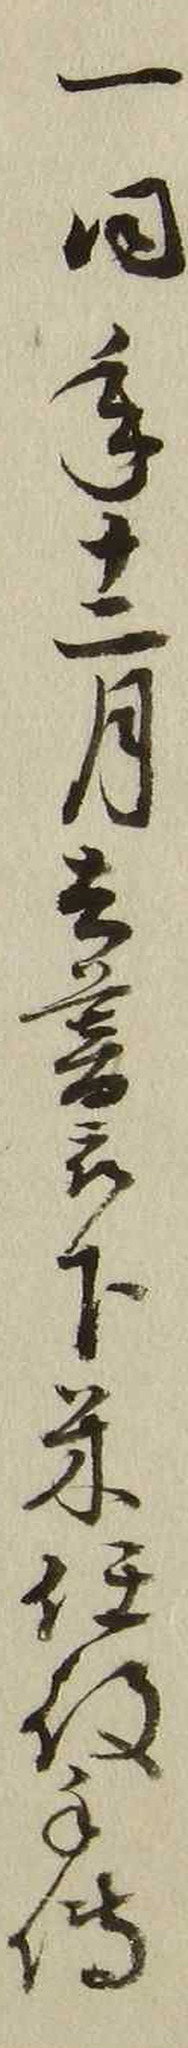一同年十二月去暮被下米任役手伝
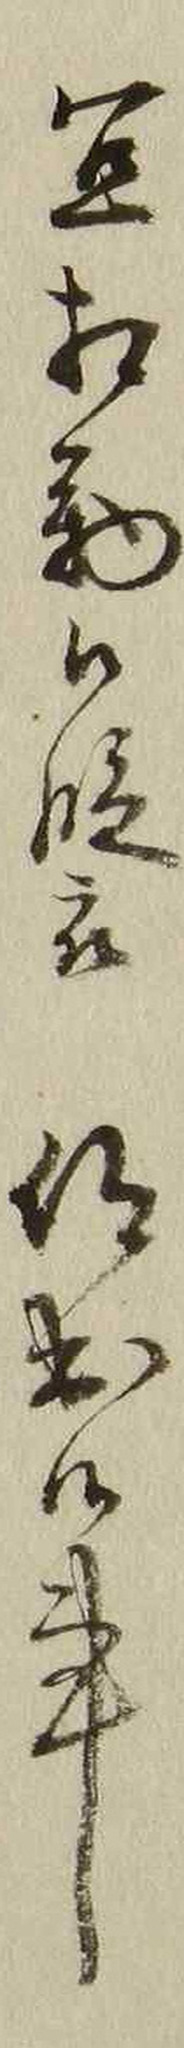宜相勤候段被仰出候事
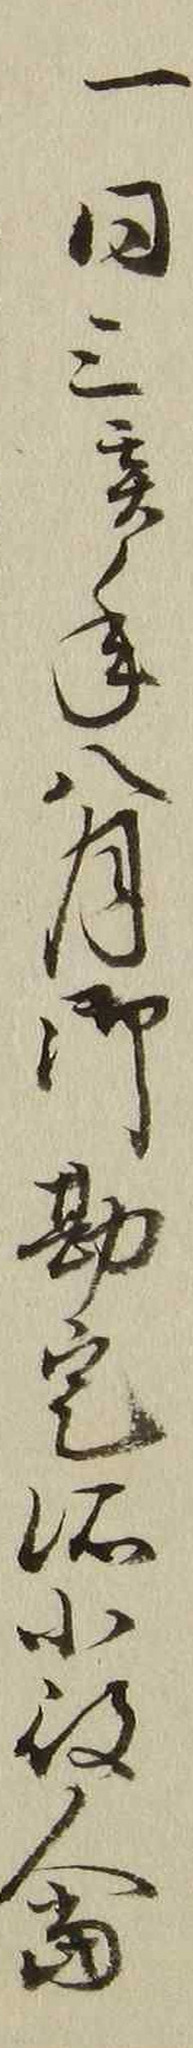一同三亥年八月御勘定所小役人当
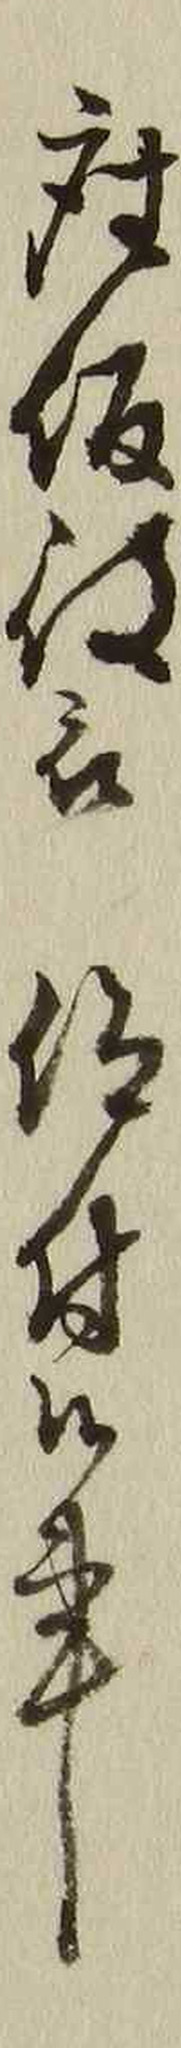座仮役被仰付候事
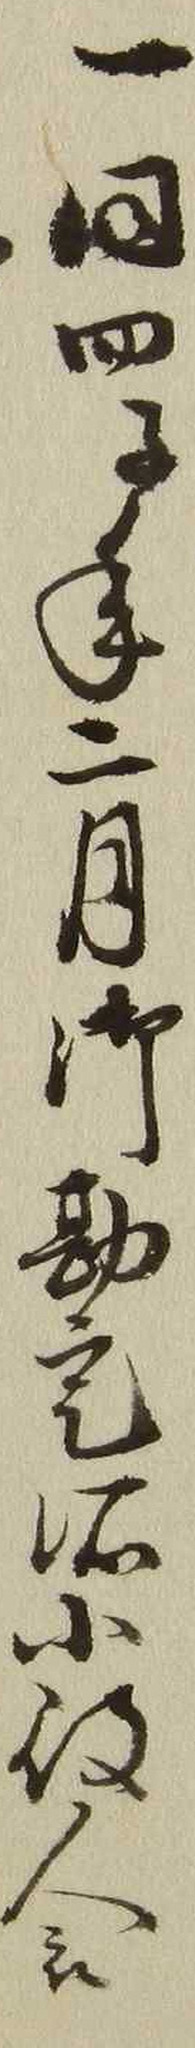一同四子年二月御勘定所小役人被
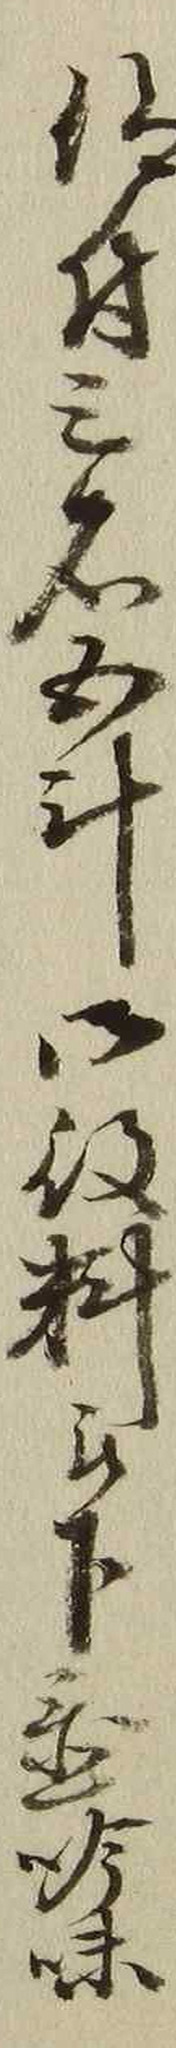仰付三石五斗御役料被下置吟味
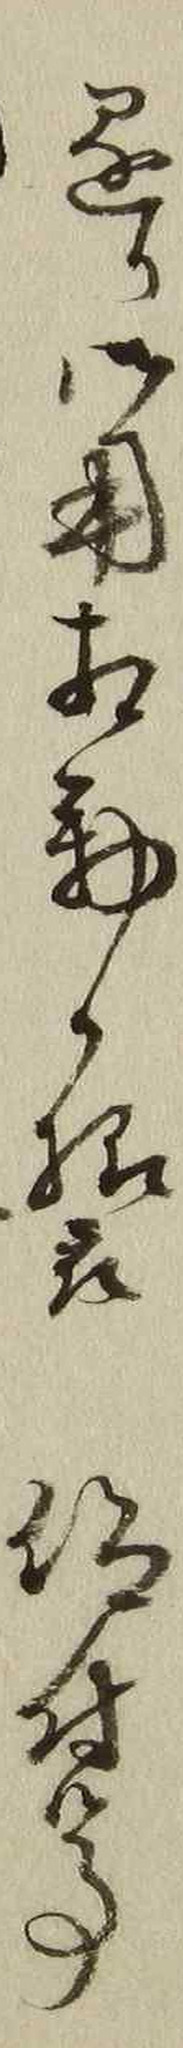懸り御用相勤候様被仰付候事
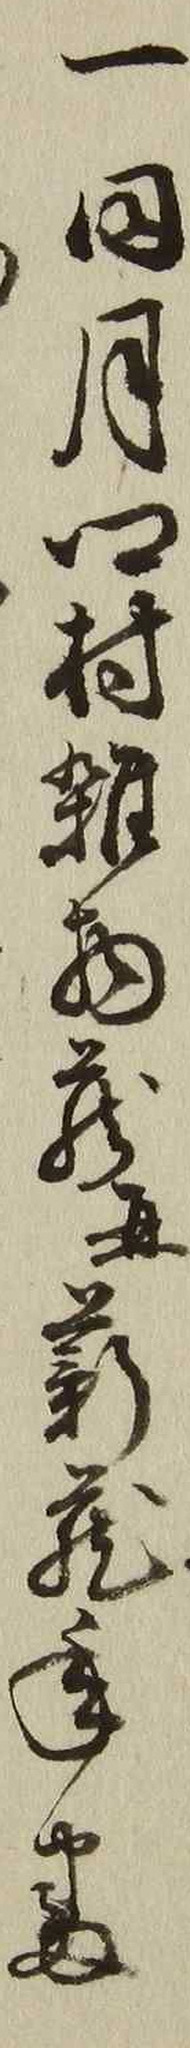一同月郷村雑物蔵并薪蔵年番
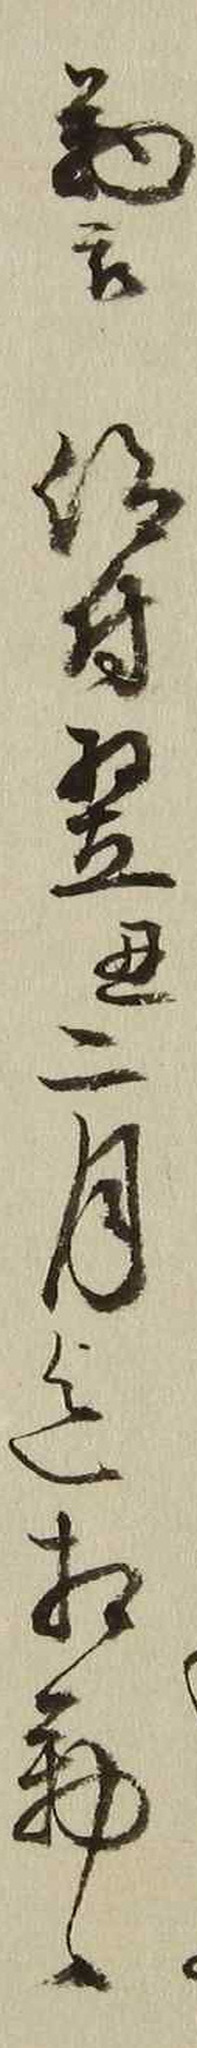勤被仰付翌丑二月迄相勤候
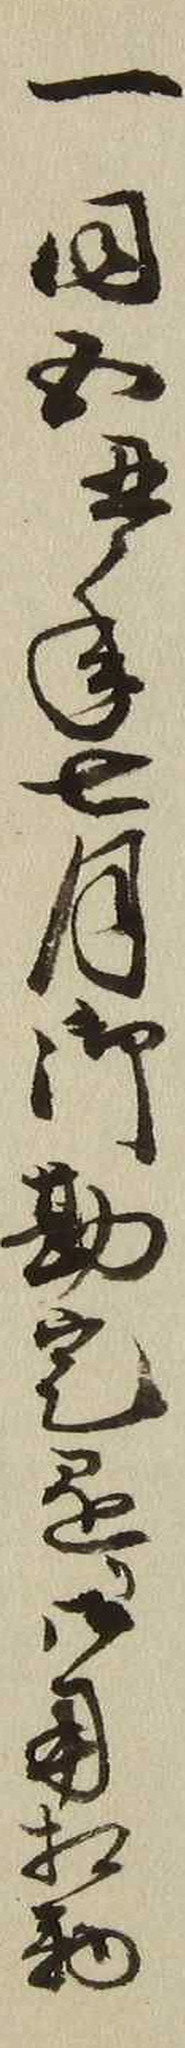一同五丑年七月御勘定懸り御用相勤
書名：諸士系譜　巻之38　は之部6
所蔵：会津若松市立会津図書館
